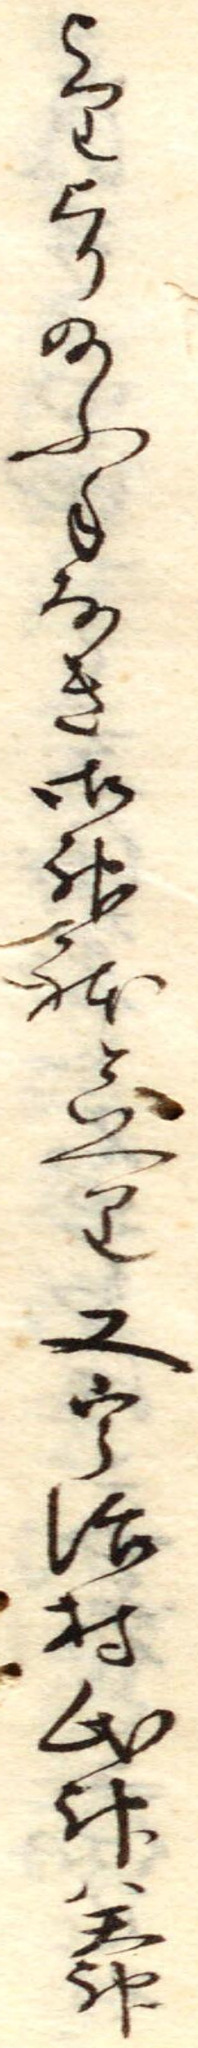より上り給ふ手なき御神躰といへり又宇治村氏神は天神
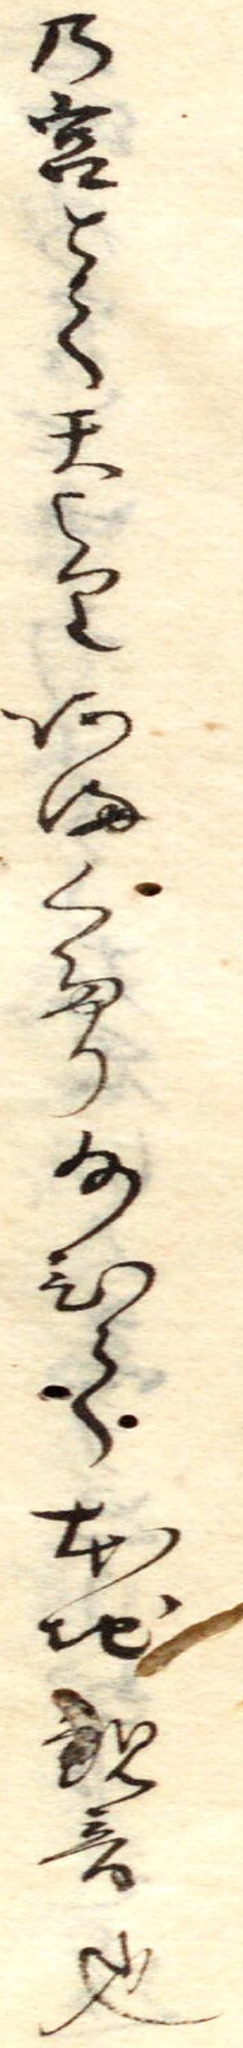の宮とて天よりあまくたり給ひて本地観音也
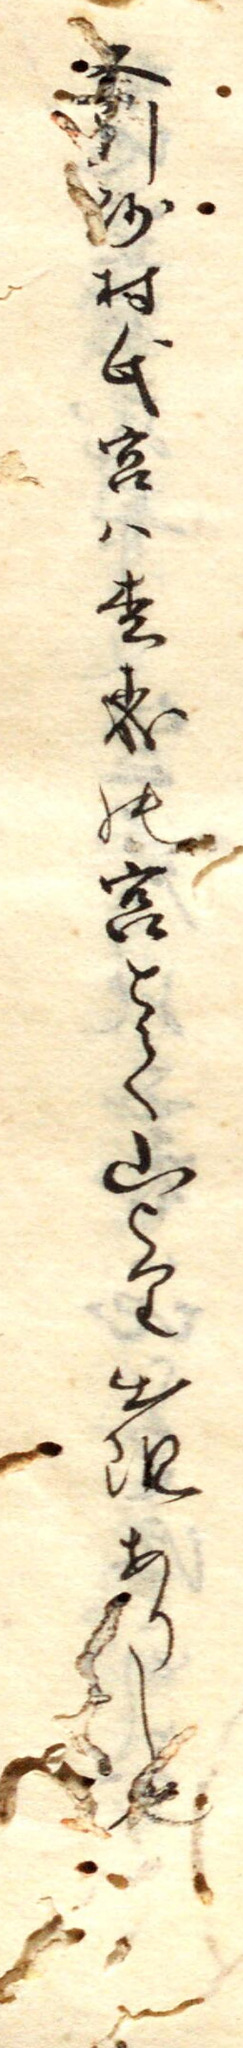又引砂村氏宮は松森の宮とて山より出現ありし也
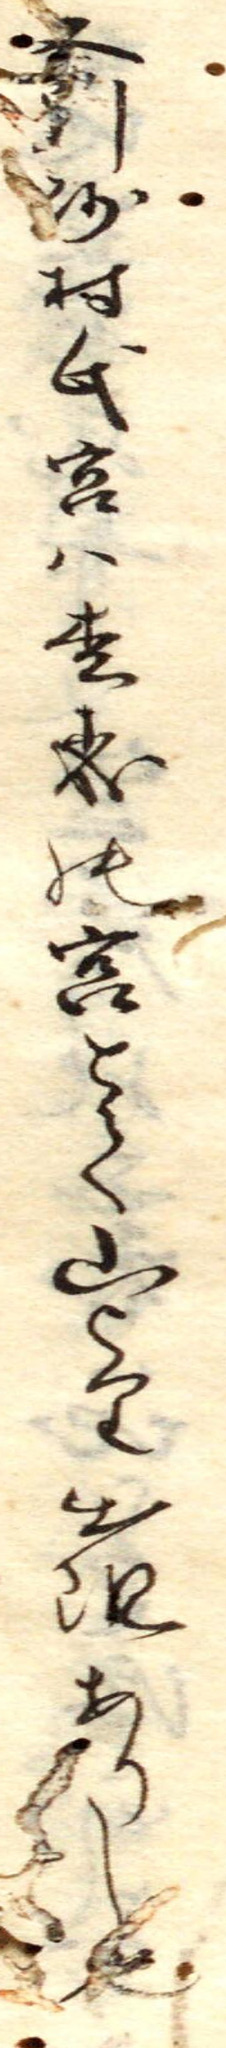又引砂村氏宮は松森の宮とて山より出現ありし也

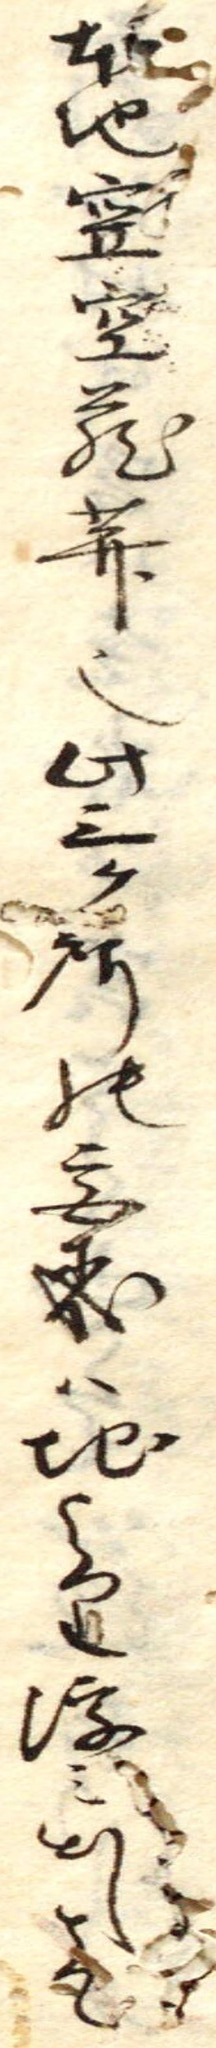本地虚空蔵菩薩也此三ヶ所の宮森は地より浮み出しとて
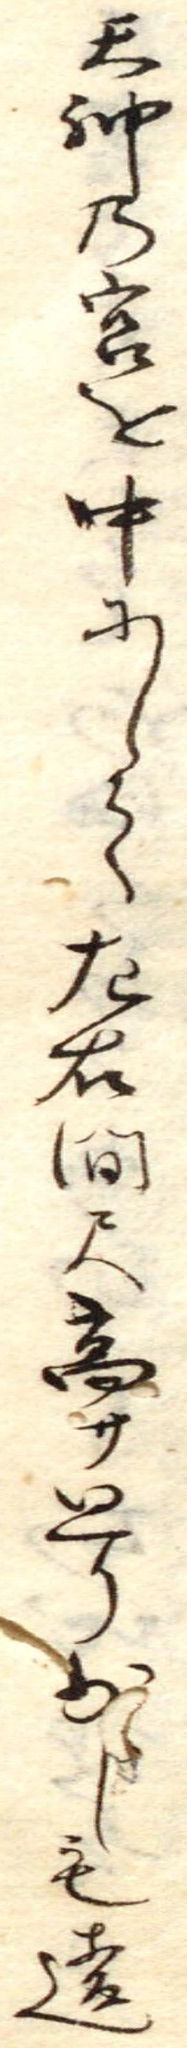天神の宮を中にして左右間尺高さ廻り少しも違
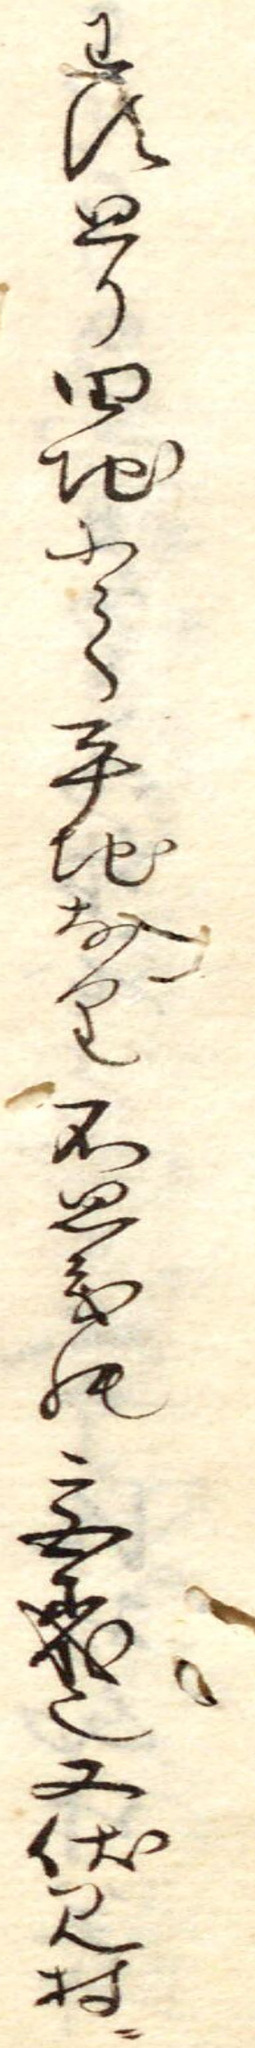わす廻り田地にて平地なり不思義の宮森也又伏見村に
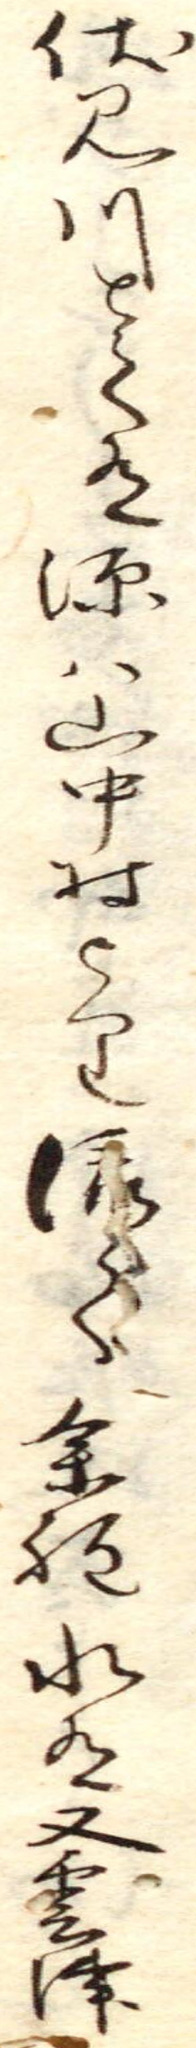伏見川とて有源は山中村より流て余程水有又雲津
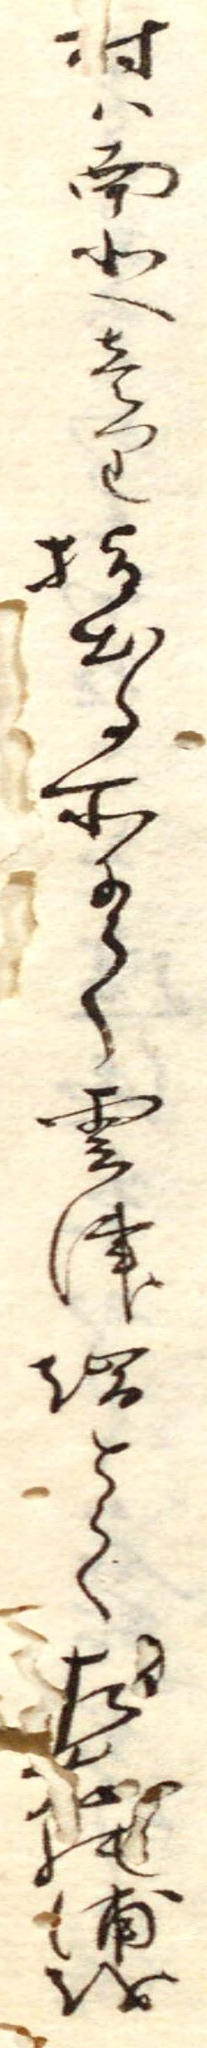村は南北へ壱里指出る所にて雲津端とて左右の浦を
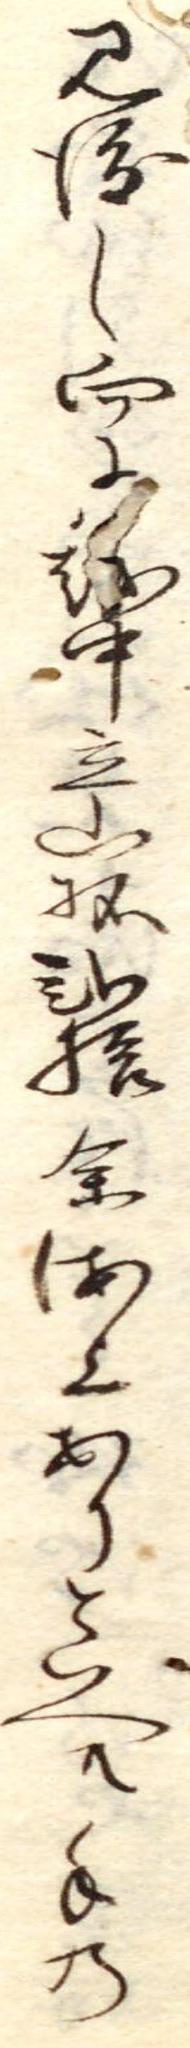見渡し向には越中立山抔弐拾余海上ありといへ共手の
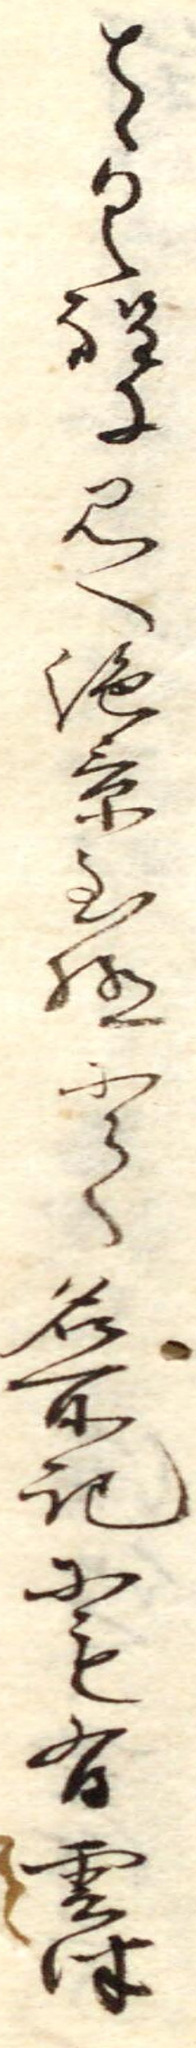とゝく程に見へ絶景至極にて名所記にも有雲津
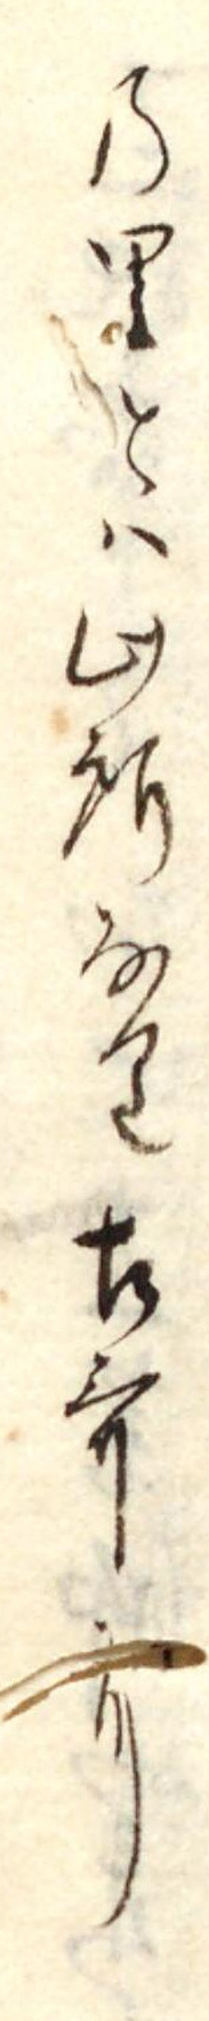の里とは此所なり古哥に
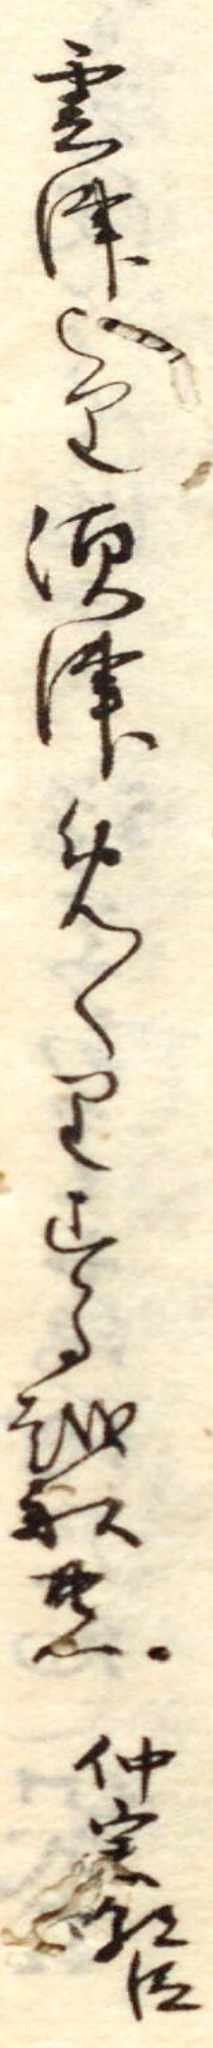雲津の里須津めくりする越船の仲家朝臣
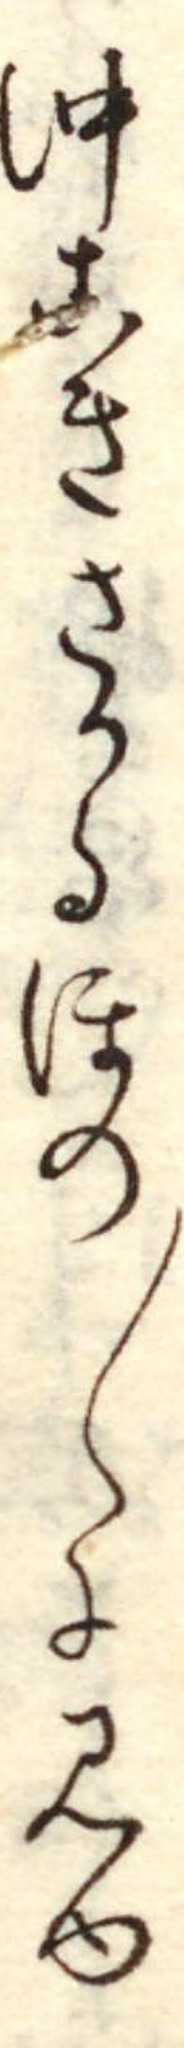沖こきさかるほの〳〵に見ゆ
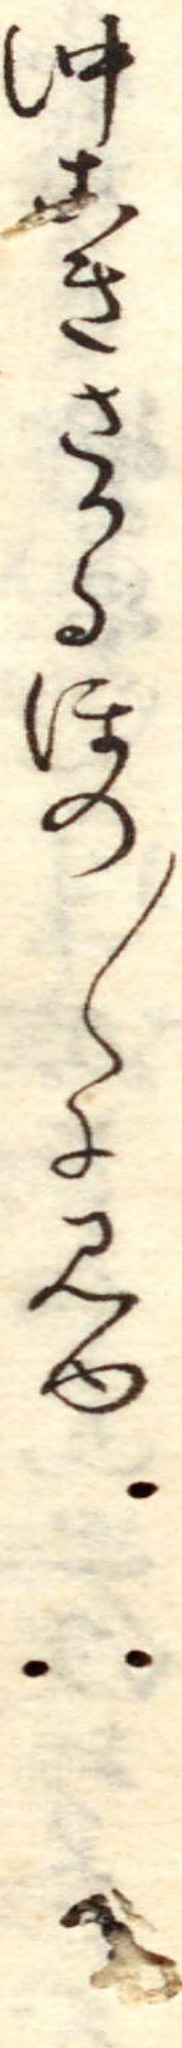沖こきさかるほの〳〵に見ゆ
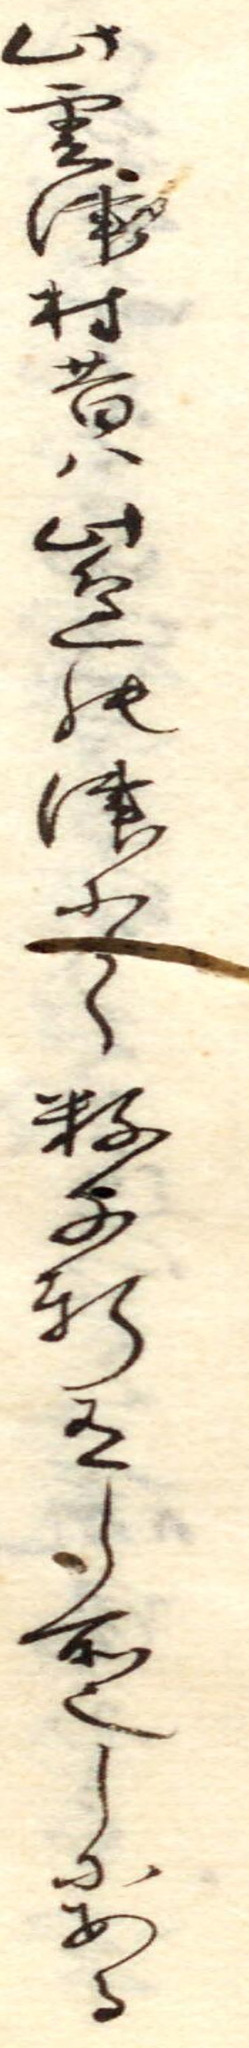此雲津村昔は此辺の津にて数千軒有し所也しにある
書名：能登名跡誌
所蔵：Ishikawa Prefectural Library
